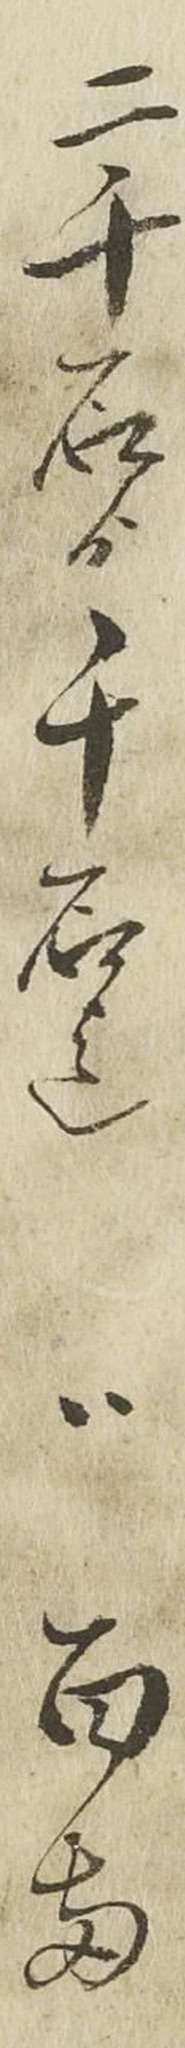二千石ゟ千石迄同百両
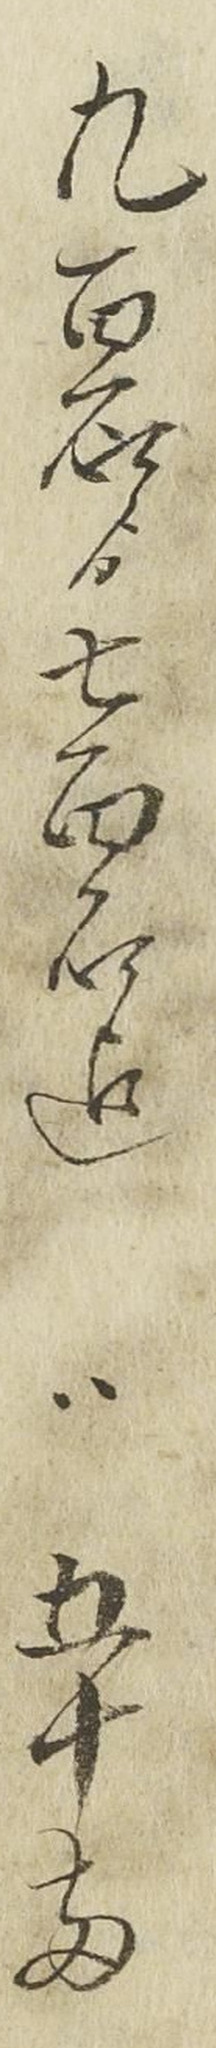九百石ゟ七百石迄同五十両
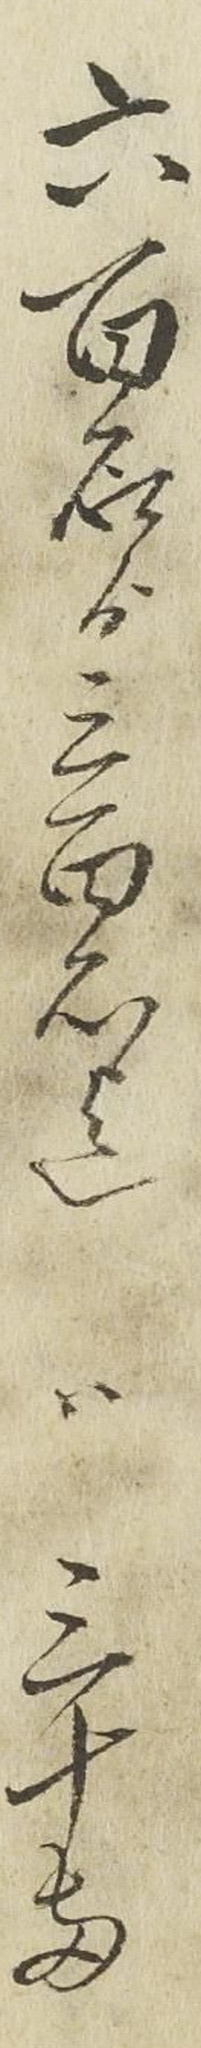六百石ゟ三百石迄同三十両
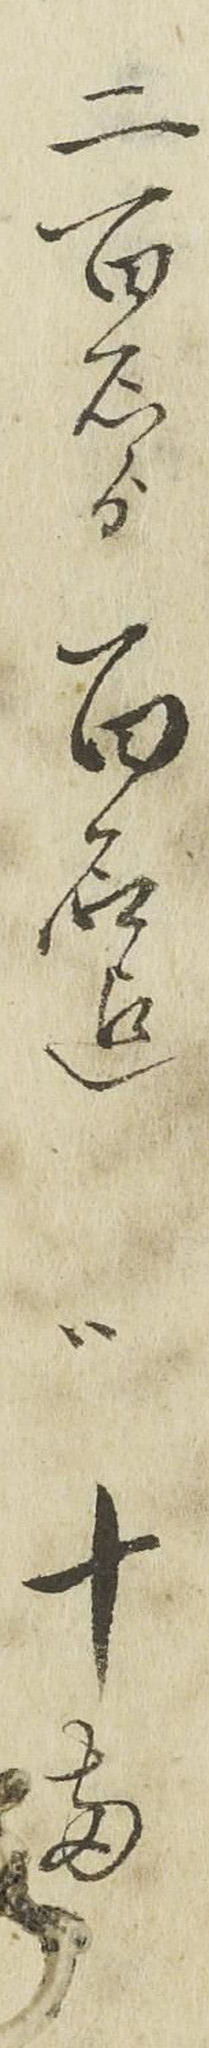二百石ゟ百石迄同十両
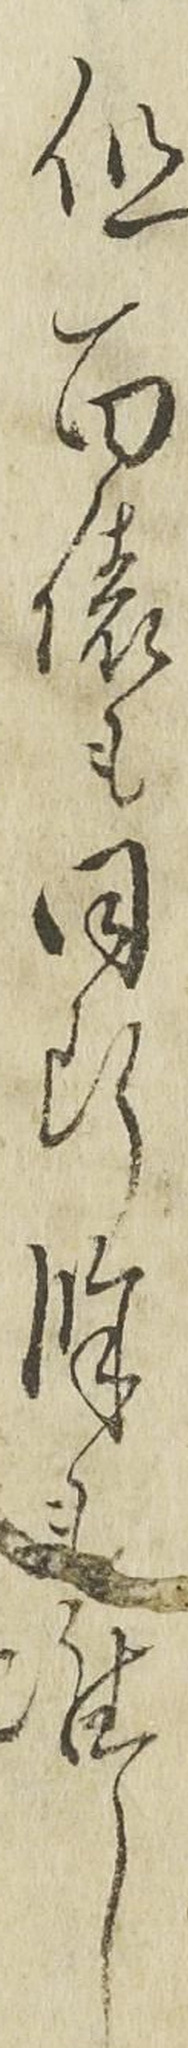但百俵も同断餘も准し
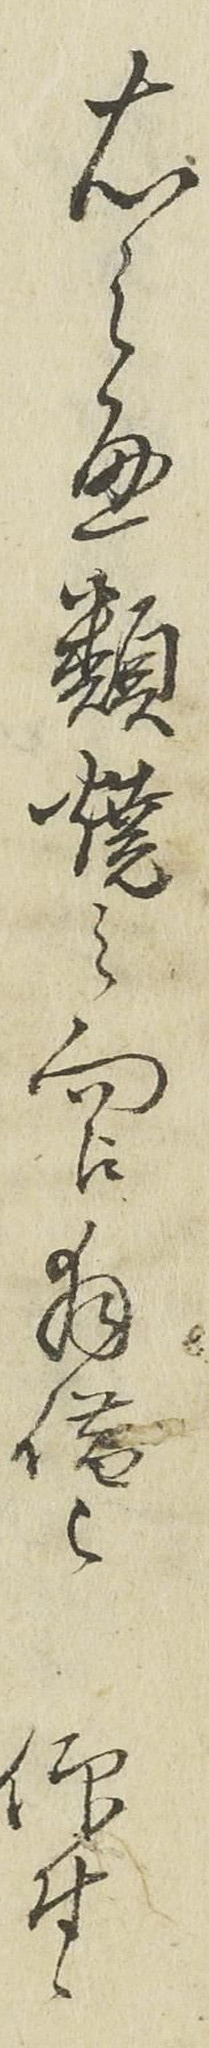右之通類焼之向え拝借被仰付候

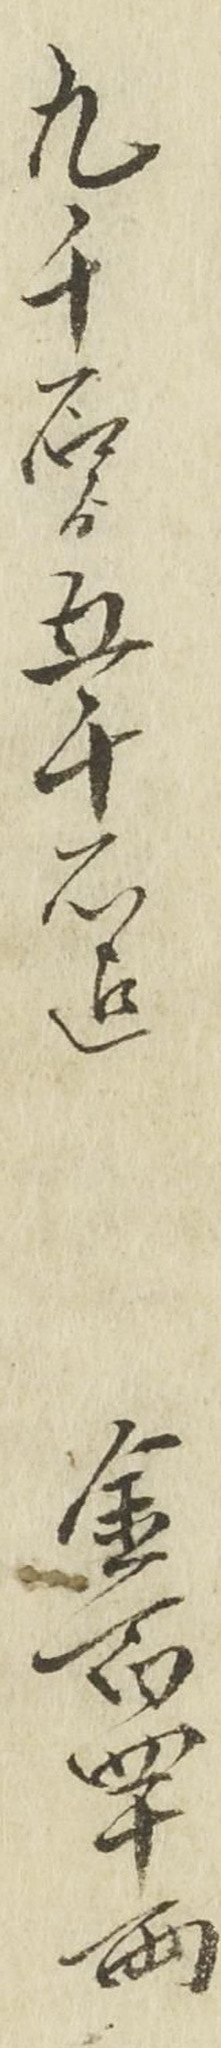九千石ゟ五千石迄金百四十両
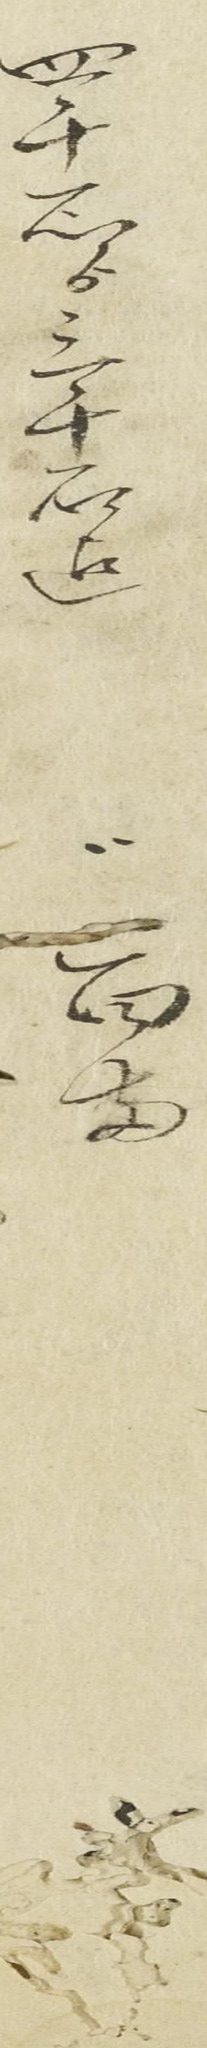四千石ゟ三千石迄同百両
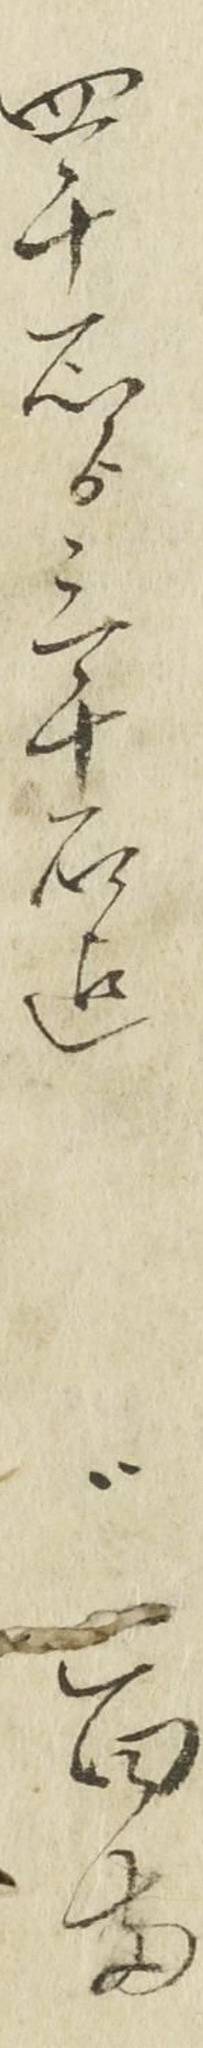四千石ゟ三千石迄同百両
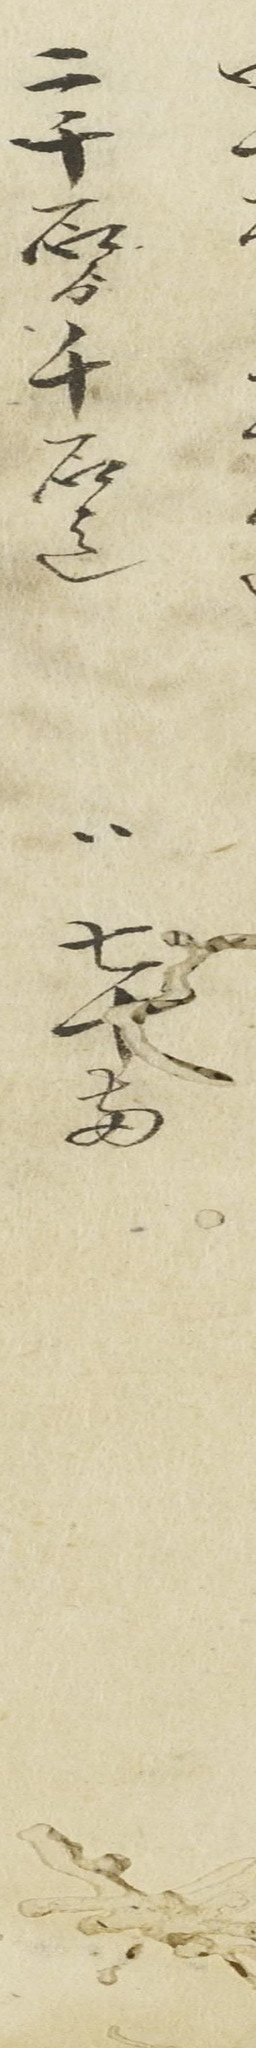二千石ゟ千石迄同七十両
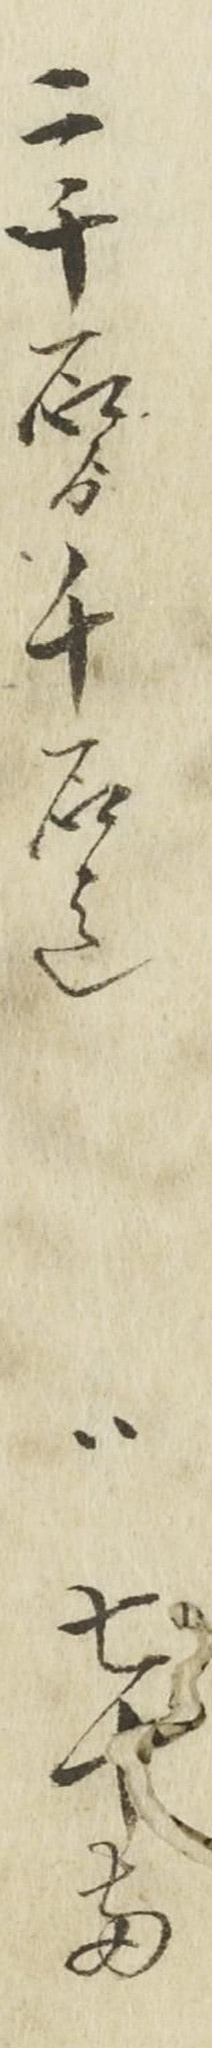二千石ゟ千石迄同七十両
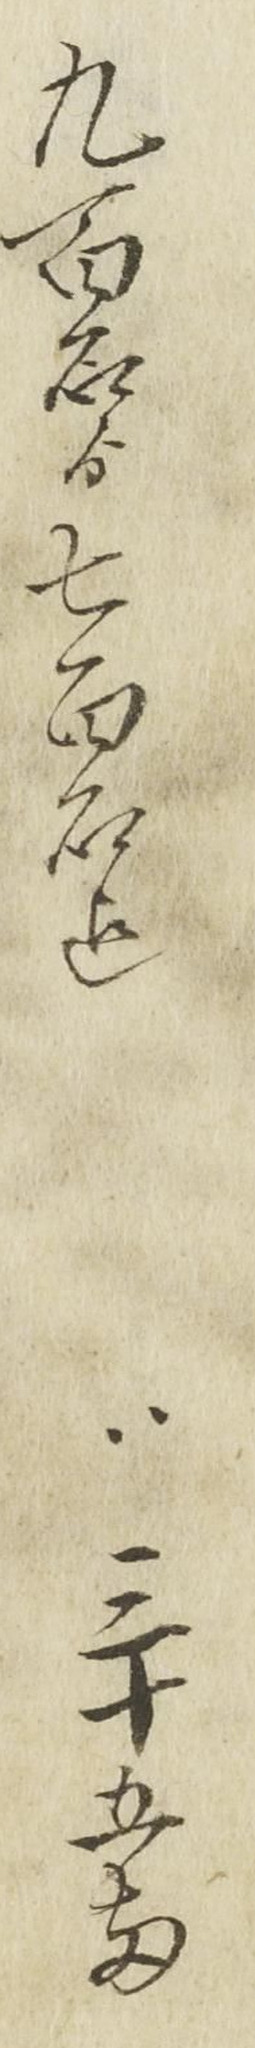九百石ゟ七百石迄同三十五両
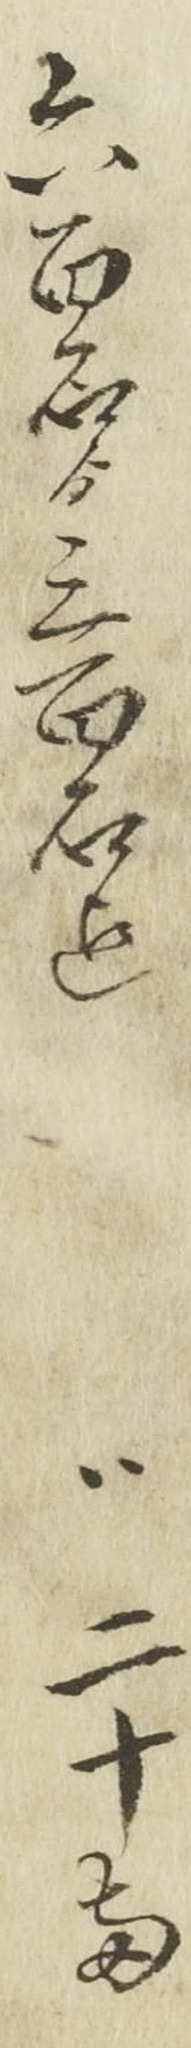六百石ゟ三百石迄同二十両
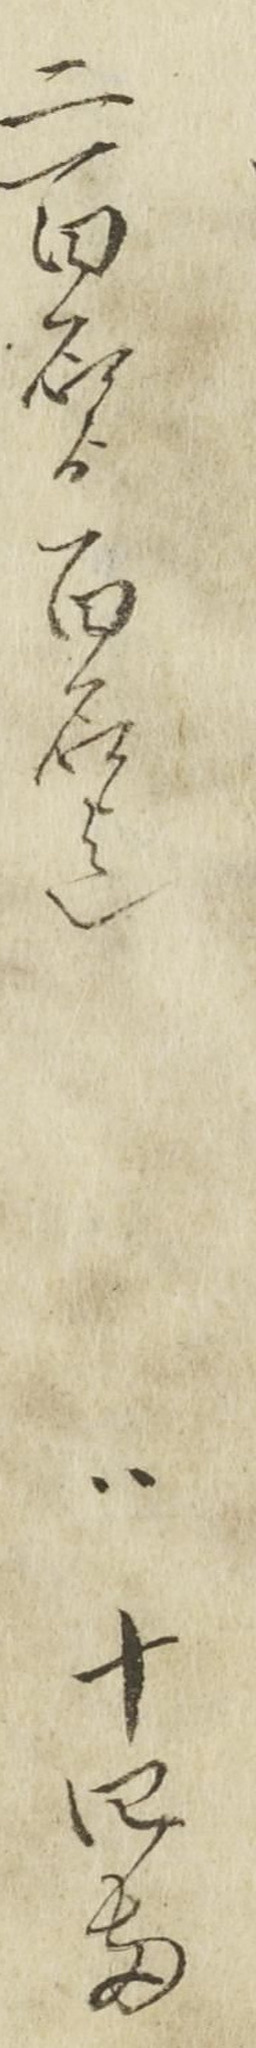二百石ゟ百石迄同十四両
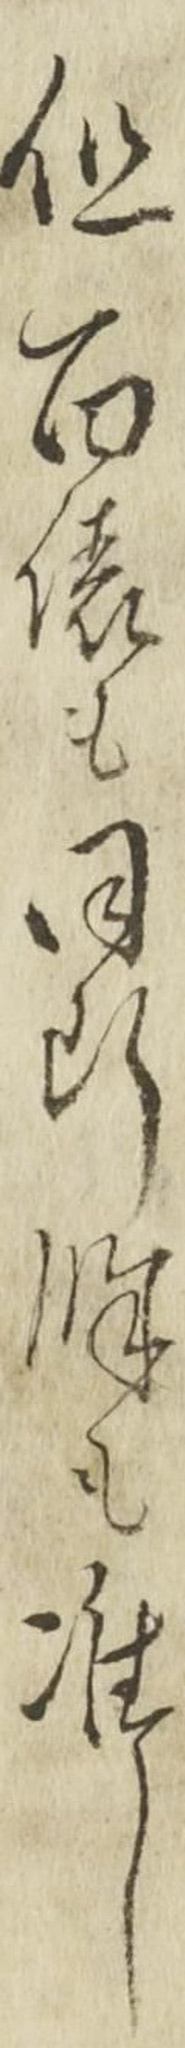但百俵も同断余も准し
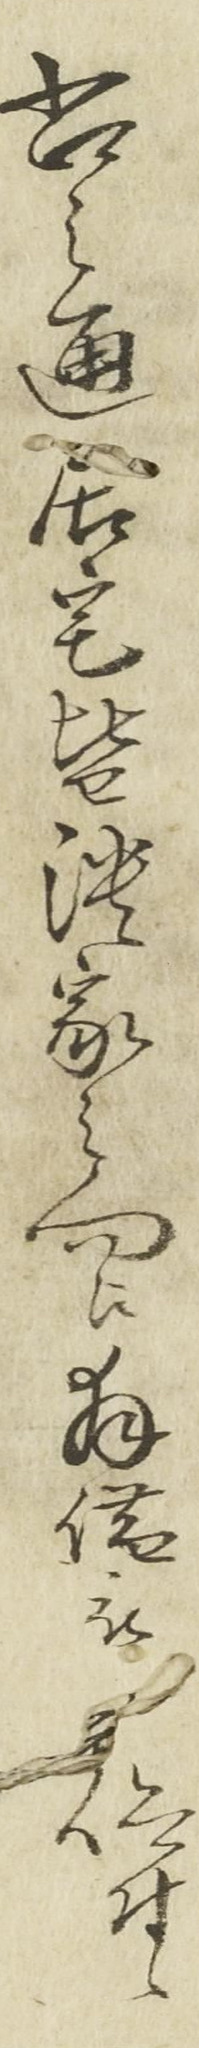右之通居宅皆潰家之向江拝借被仰付候
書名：安政二乙卯年十月二日大地震之事
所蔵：東京大学地震研究所図書室 Earthquake Research Institute Library, The University of Tokyo, JAPAN
